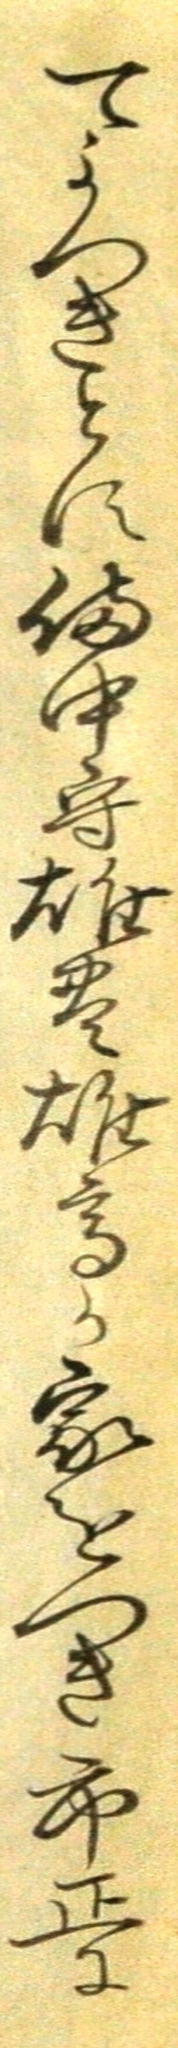てよつきとす備中守雄豊雄高か家をつき市正に
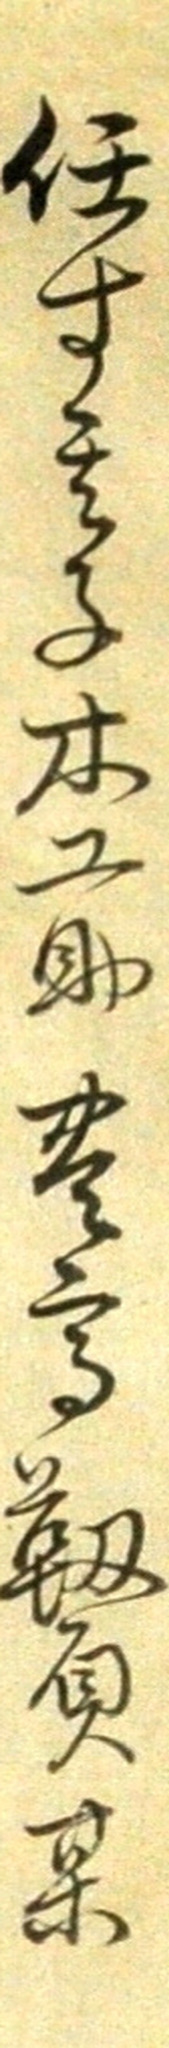任す其子木工助豊高靱負某
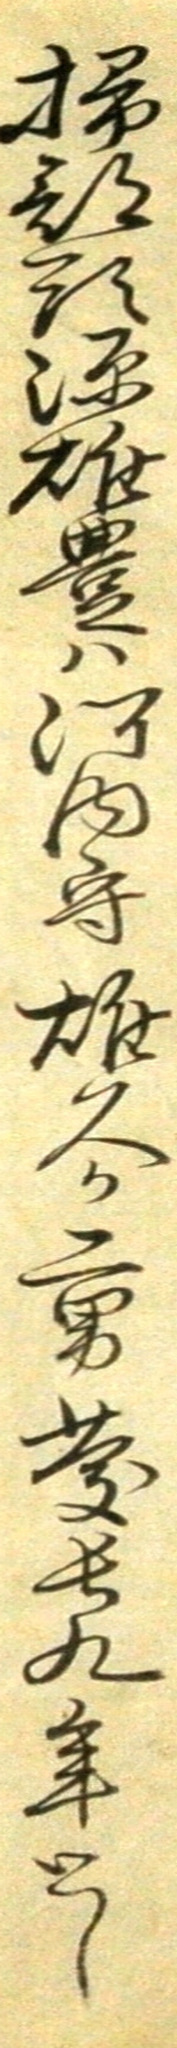掃部頭源雄豊は河内守雄久か二男慶長九年とし
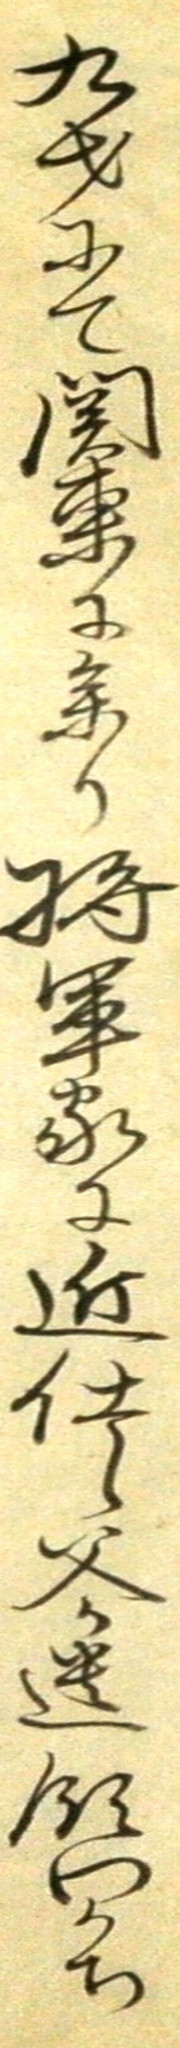九才にて関東に参り将軍家に近仕し父か遺領わかち
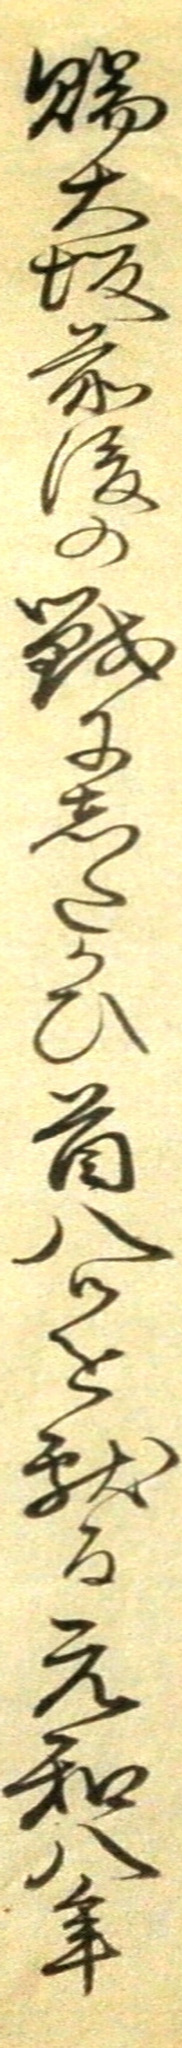賜大坂前後の戦にしたかひ首八ツを献る元和八年
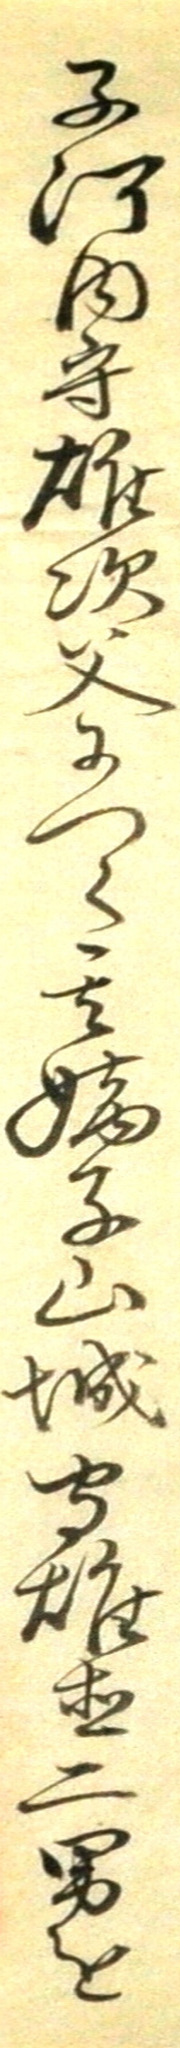子河内守雄次父につく其嫡子山城守雄直二男を
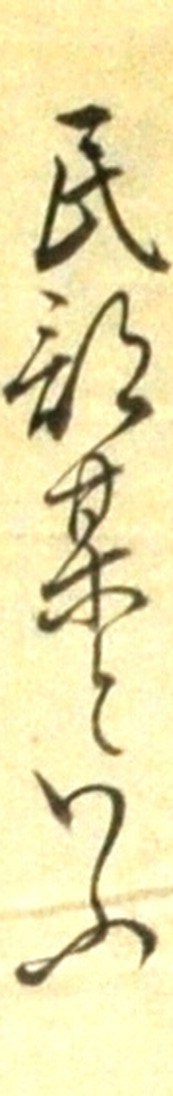民部某といふ
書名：藩翰譜（八・下）
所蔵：伊那市立高遠町図書館・合同会社AMANE
